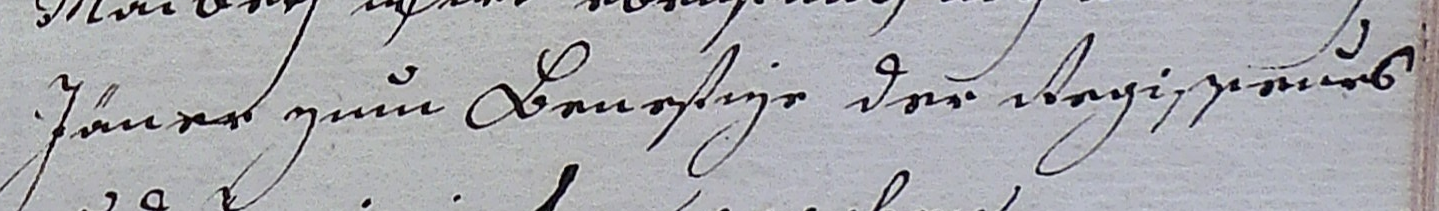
Jäner zum Benefize der Regisseurs
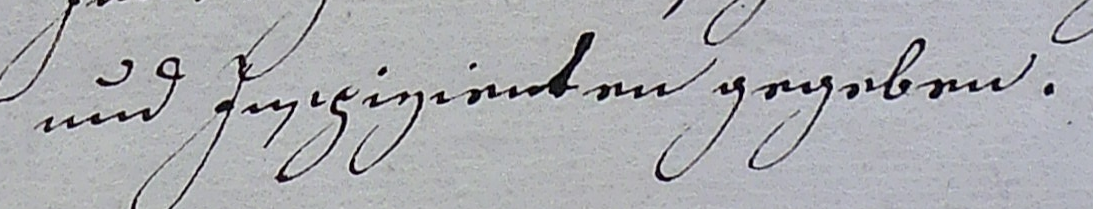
und Jnspizienten gegeben.
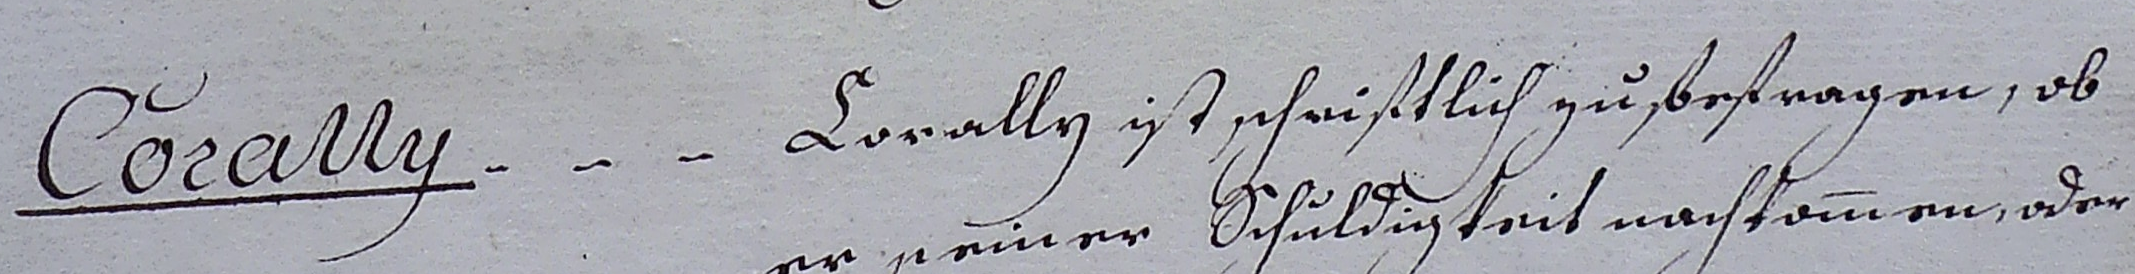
Corally .. .. .. Corally ist schriftlich zubefragen, ob
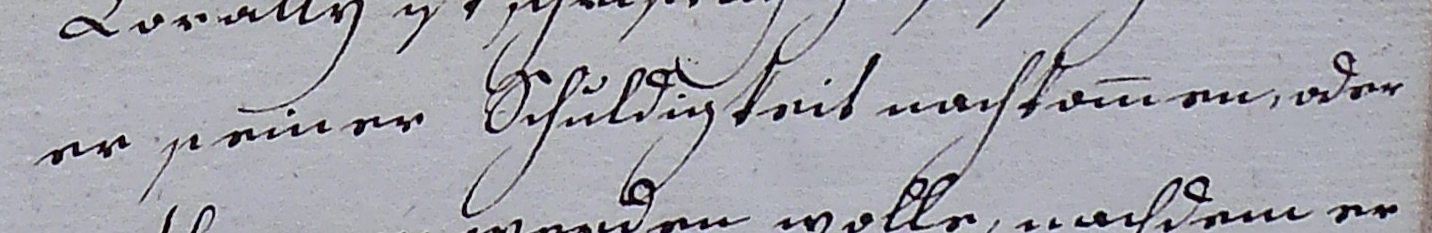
er seiner Schuldigkeit nachkom̅en, oder
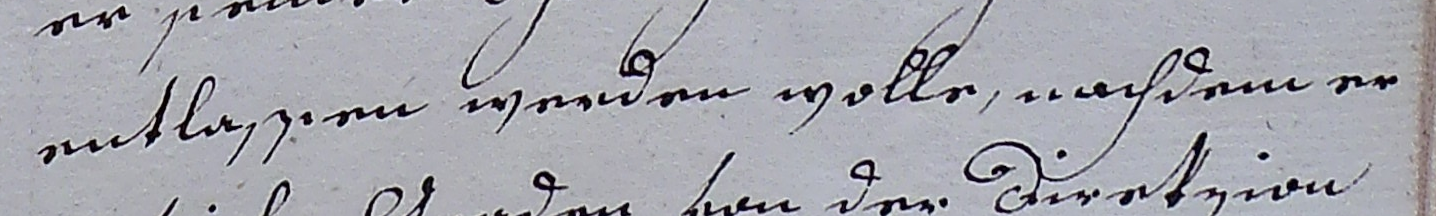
entlassen werden wolle, nachdem er
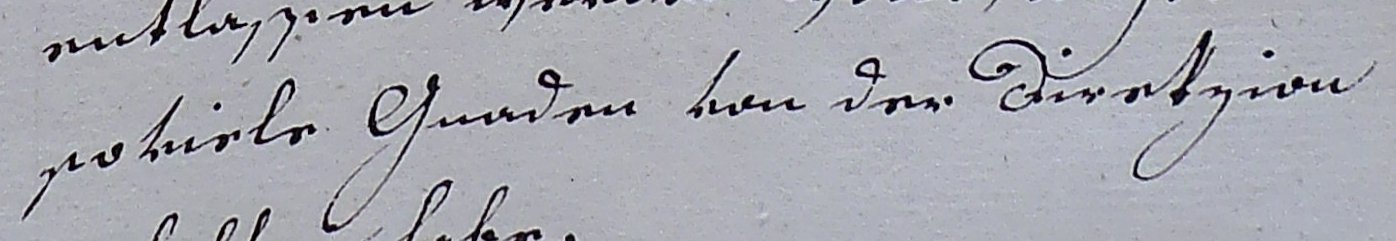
soviele Gnaden von der Direkzion
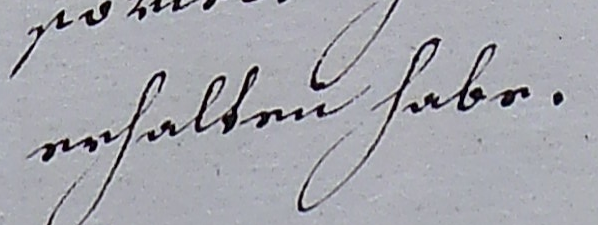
erhalten habe.
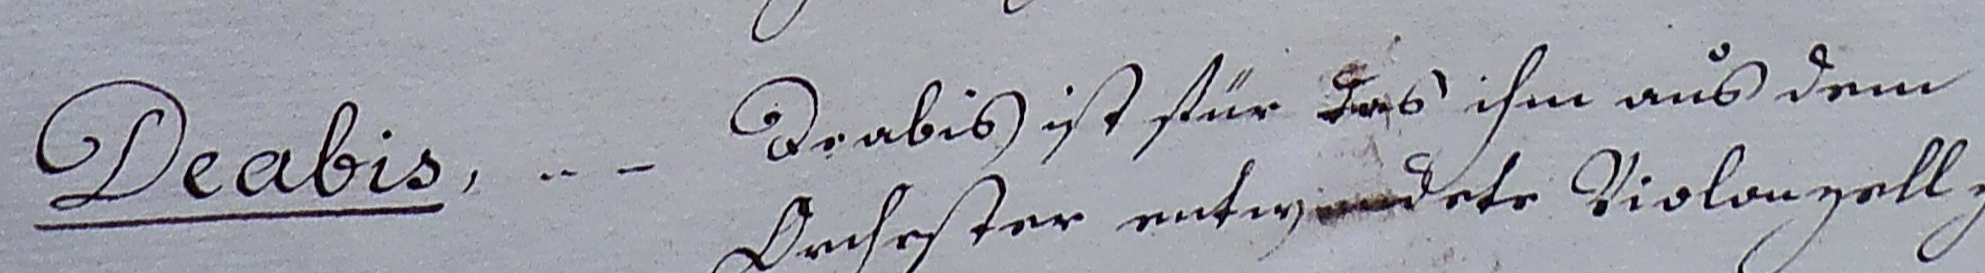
Deabis, .. .. Deabis ist für das ihm aus dem
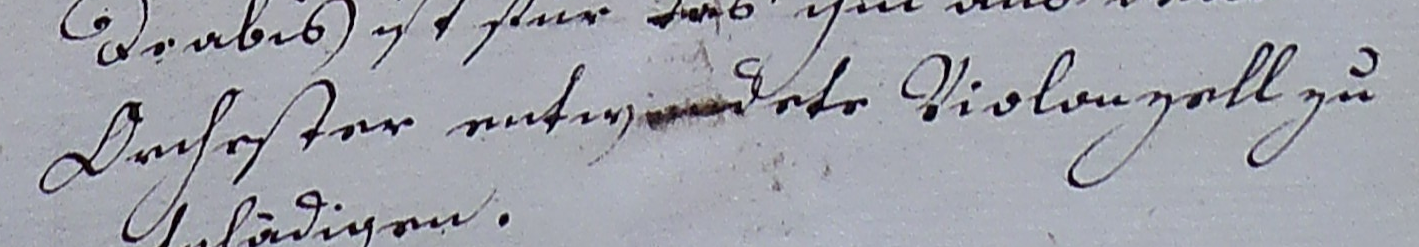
Orchester entwendete Violonzell zu
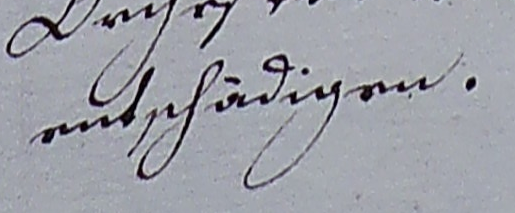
entschädigen.
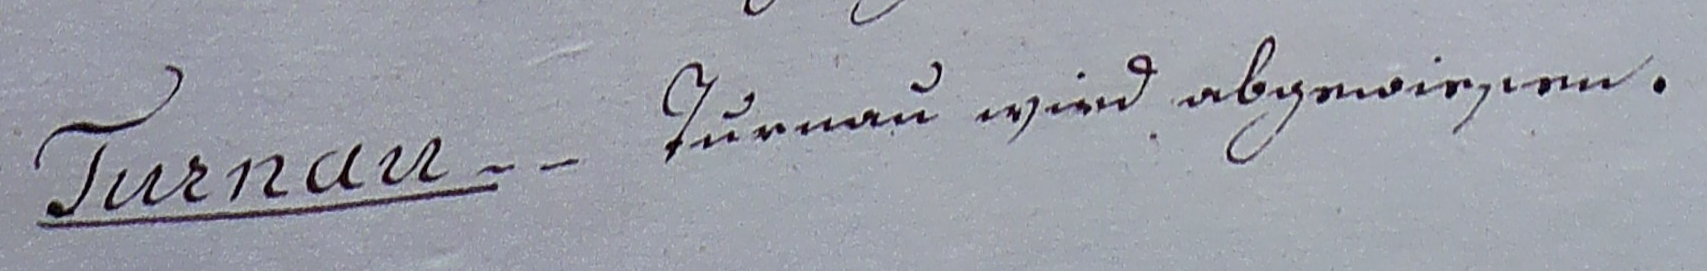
Turnau .. .. Turnau wird abgewiesen.
